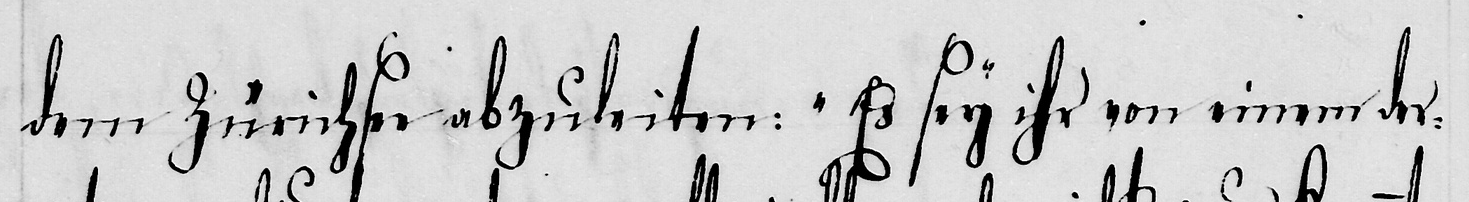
dem Zürichsee abzuleiten: „Es sey ihr von einem der¬
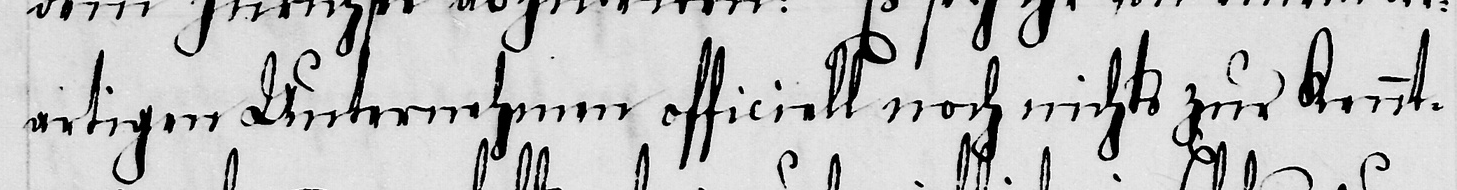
artigen Unternehmen officiell noch nichts zur Kennt¬
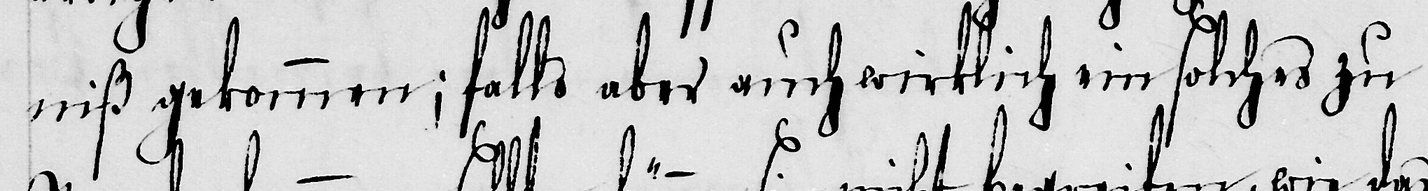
niß gekommen; falls aber auch wirklich ein solches zu
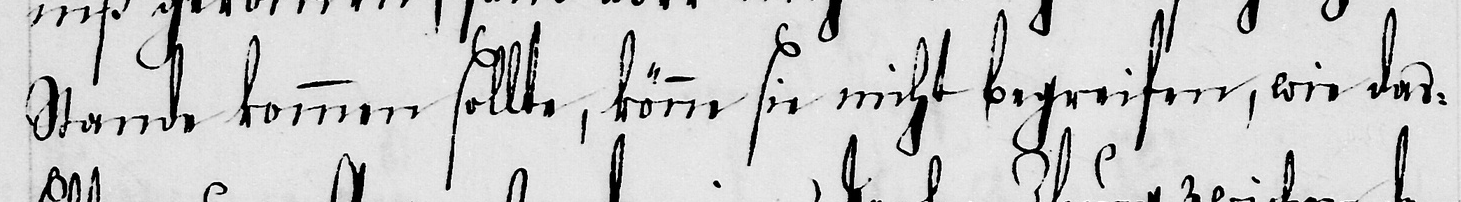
Stande kommen sollte, könne sie nicht begreifen, wie das¬
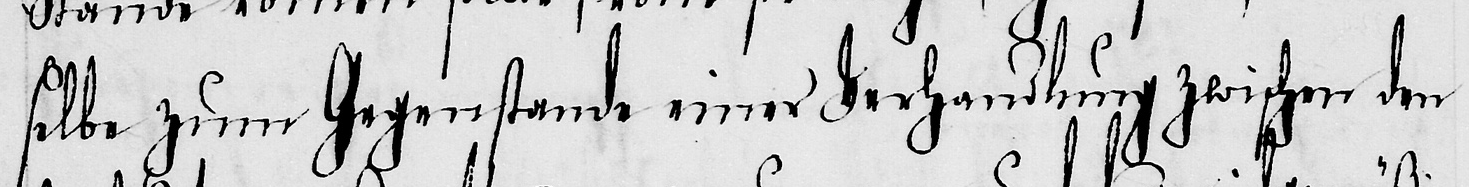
selbe zum Gegenstande einer Verhandlung zwischen den
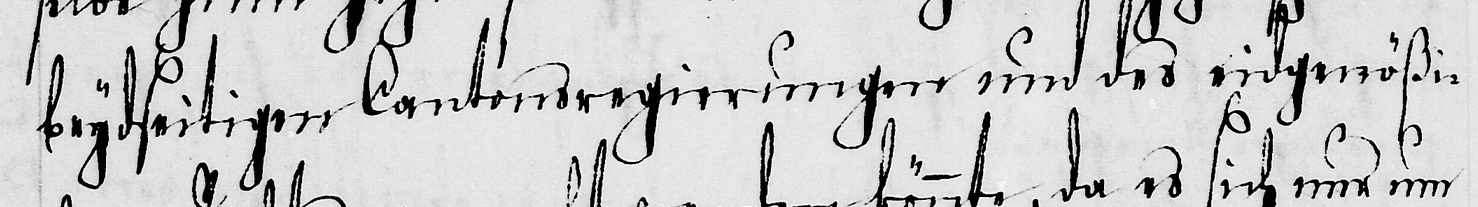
beydseitigen Cantonsregierungen und des eidgenößi¬
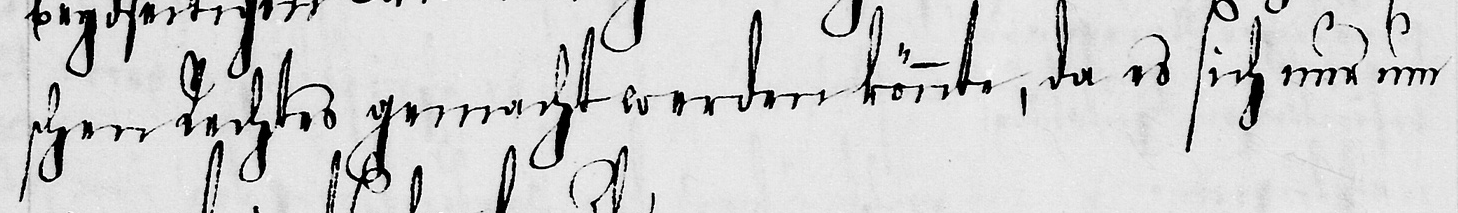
schen Rechtes gemacht werden könnte, da es sich nur um
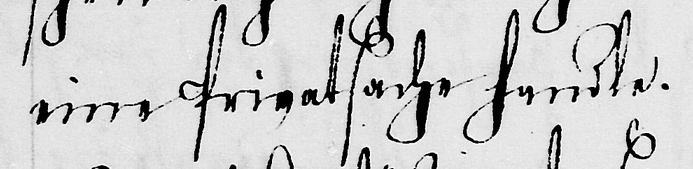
eine Privatsache handle.
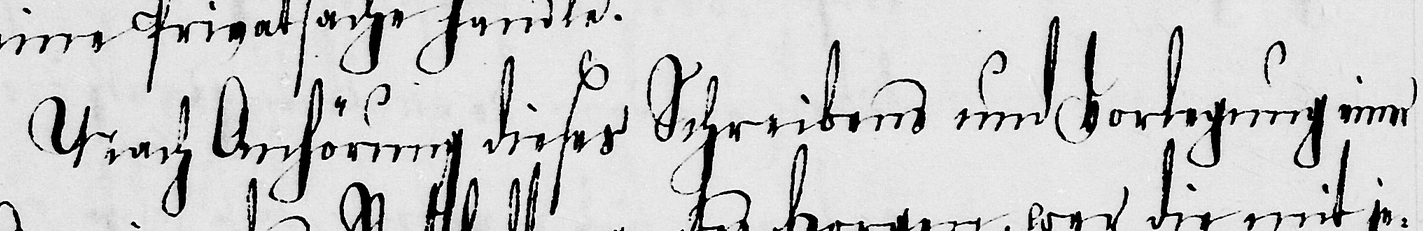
Nach Anhörung dieses Schreibens und Vorlegung ein¬
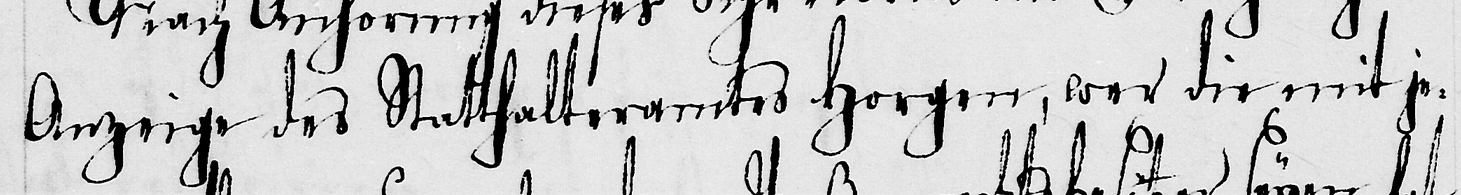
Anzeige des Statthalteramtes Horgen, wer die mit je¬
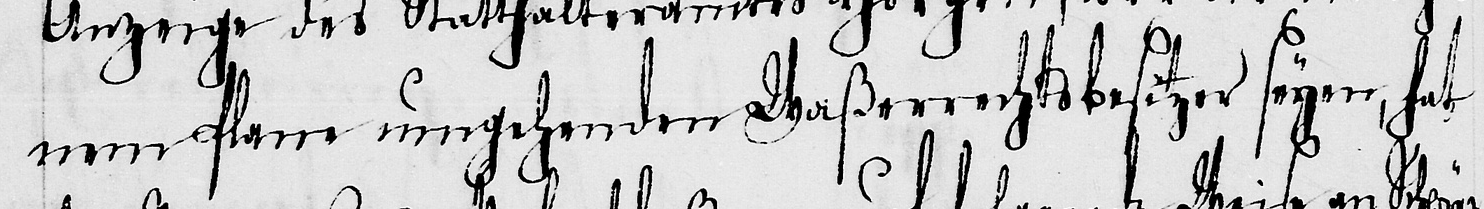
nem Plane umgehenden Waßerrechtsbesitzer seyen, hat
